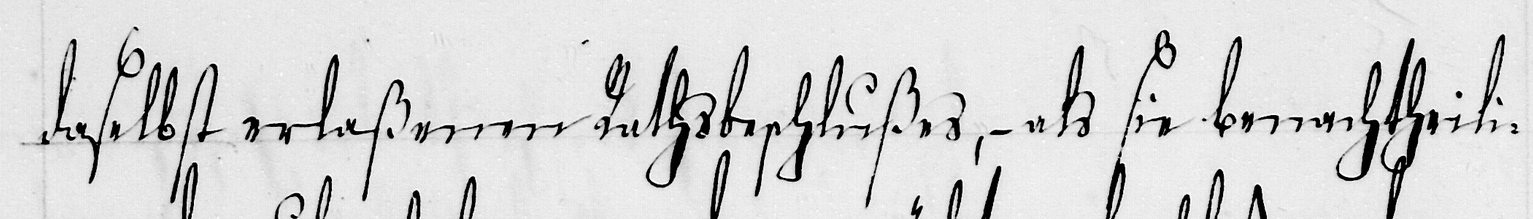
daselbst erlaßenen Rathsbeschlußes, – als sie benachtheil¬
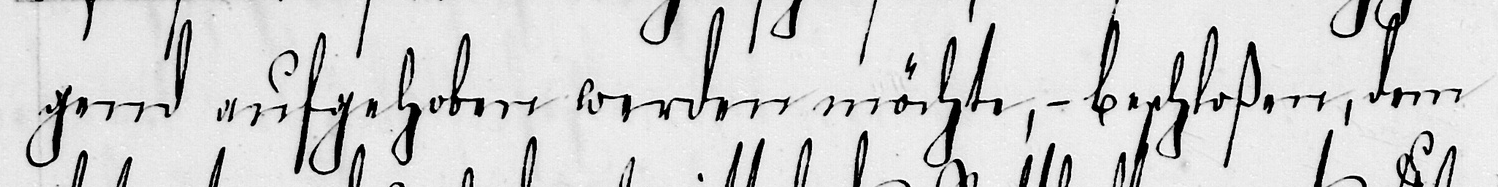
igend aufgehoben werden möchte, – beschloßen, dem
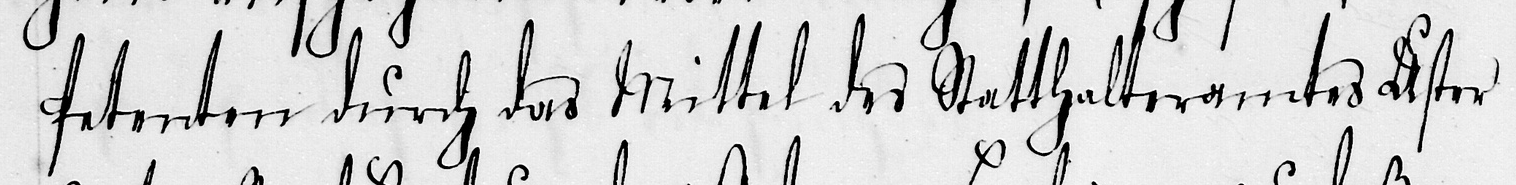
Petenten durch das Mittel des Statthalteramtes Uster
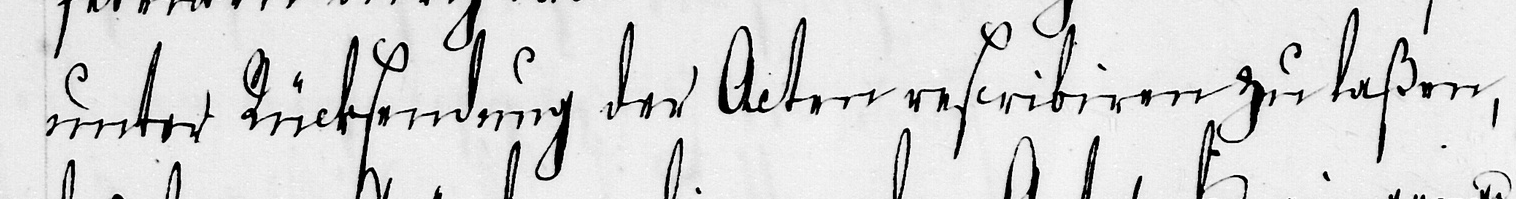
unter Rücksendung der Acten rescribiren zu laßen,
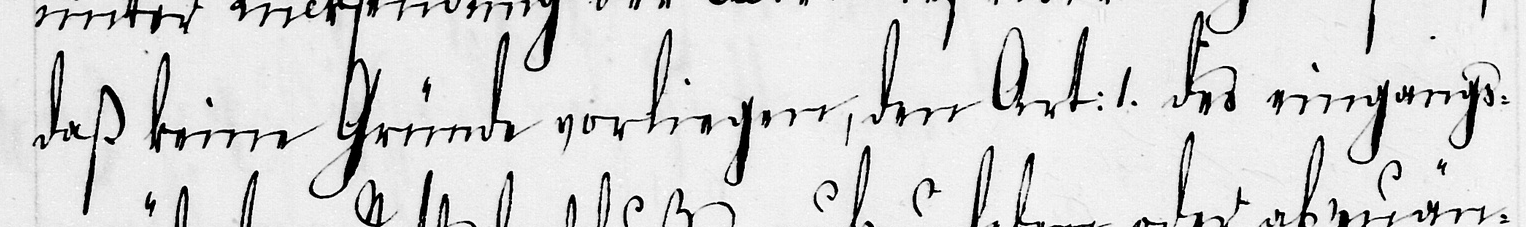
daß keine Gründe vorliegen, den Art: 1. des eingangs¬
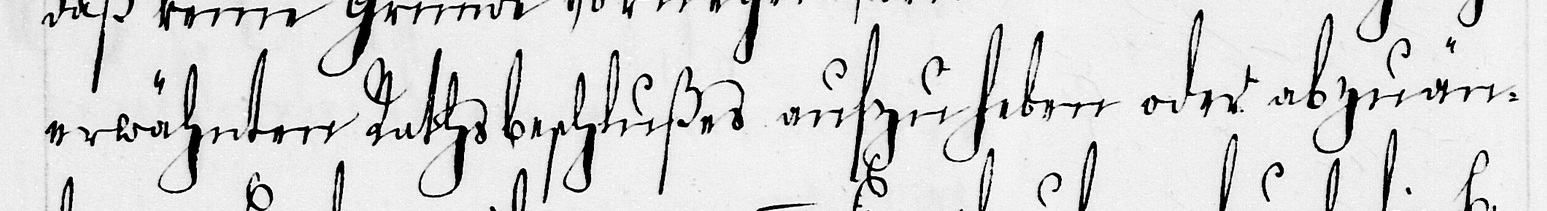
erwähnten Rathsbeschlußes aufzuheben oder abzuän¬
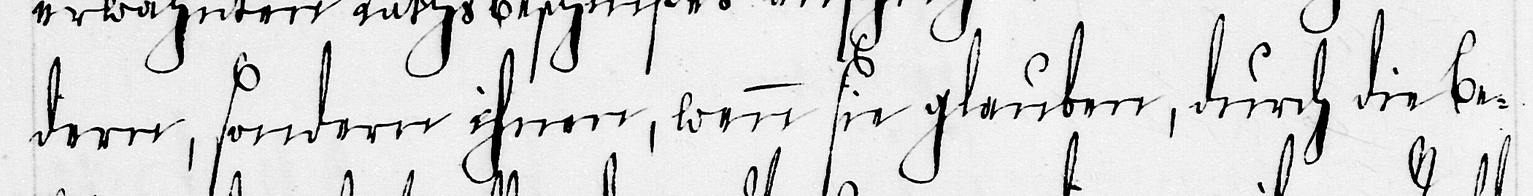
dern, sondern ihnen, wenn sie glauben, durch die Be¬
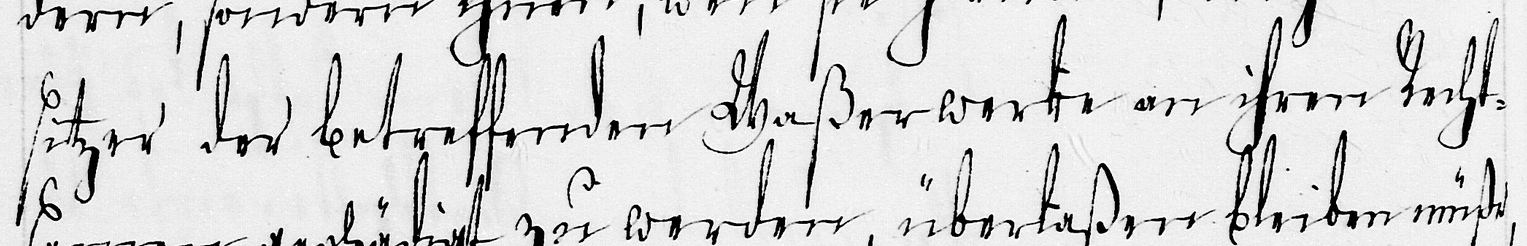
sitzer der betreffenden Waßerwerke an ihren Recht¬
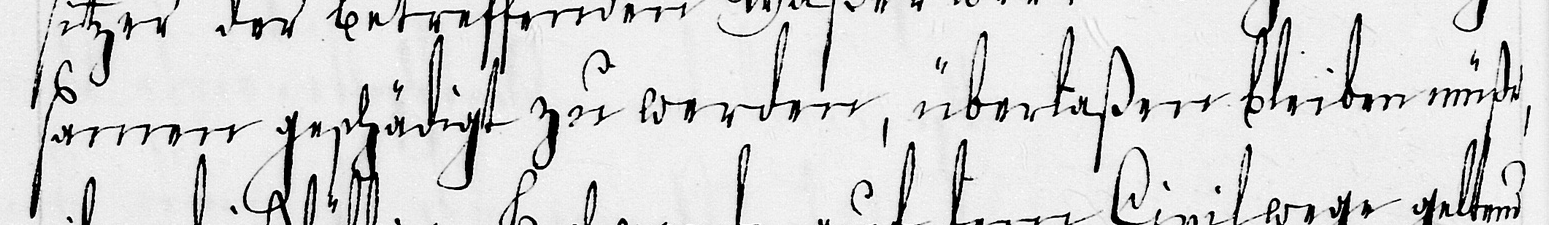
samen geschädigt zu werden, überlaßen bleiben müßte,
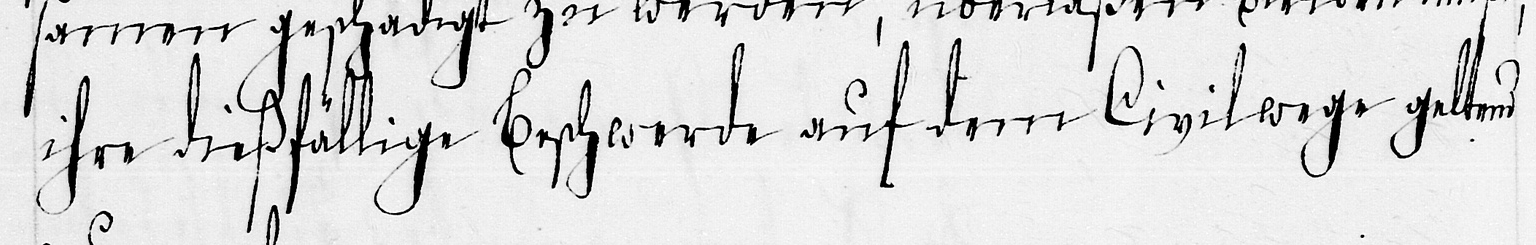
ihre dießfällige Beschwerde auf dem Civilwege geltend
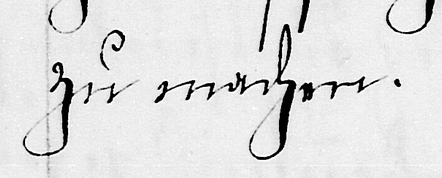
zu machen.
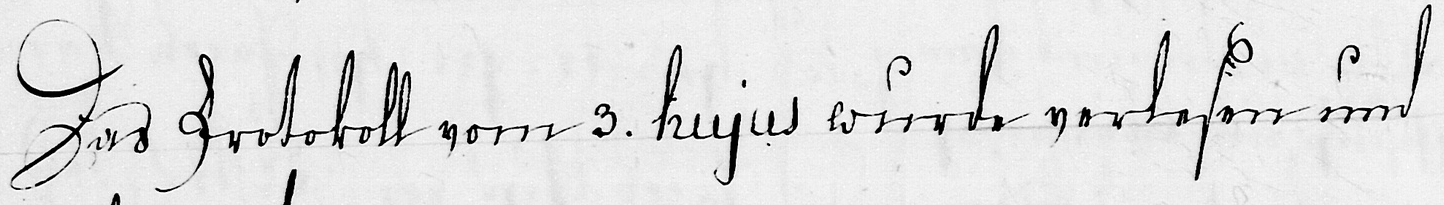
Das Protokoll vom 3. hujus wurde verlesen und
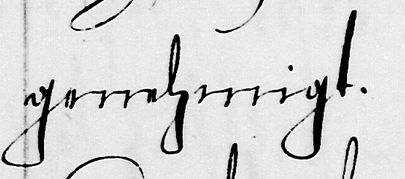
genehmigt.
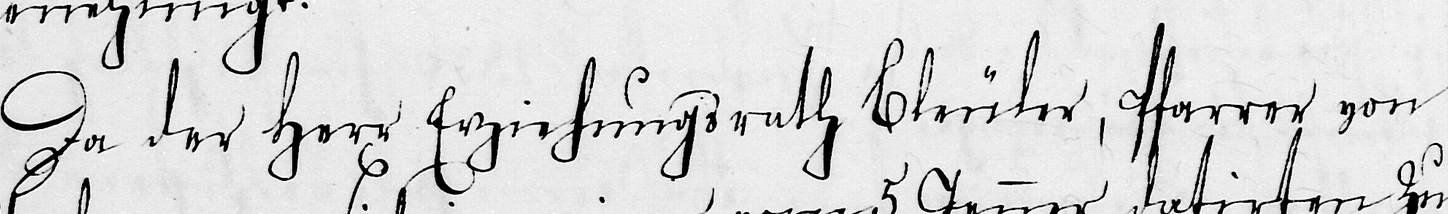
Da der Herr Erziehungsrath Bleuler, Pfarrer von
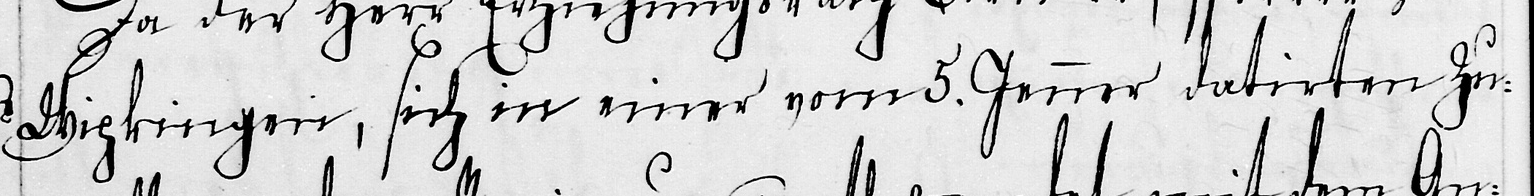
Wipkingen, sich in einer vom 5. Jenner datirten Zus¬
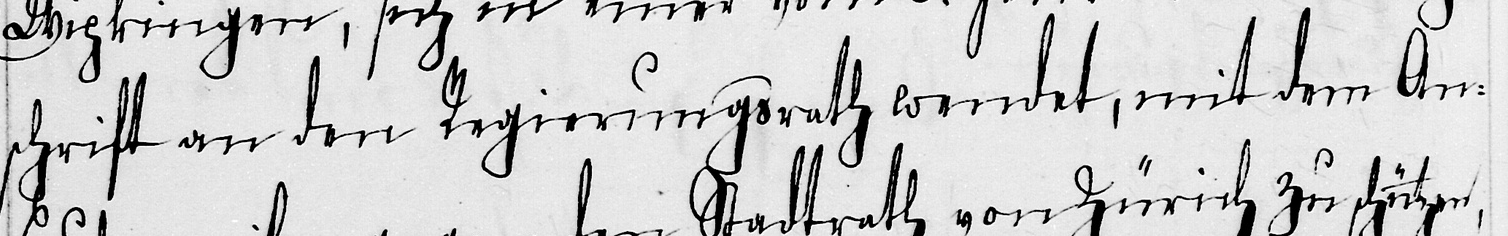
chrift an den Regierungsrath wendet, mit dem An¬
